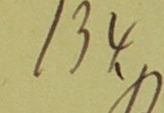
134
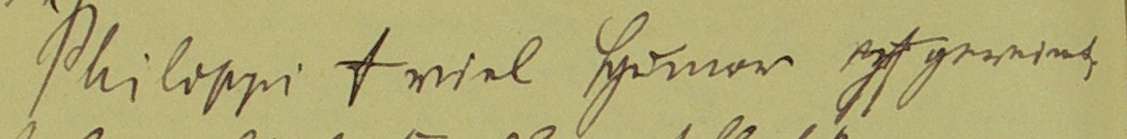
Philippi mit viel Humor zusammengereimt
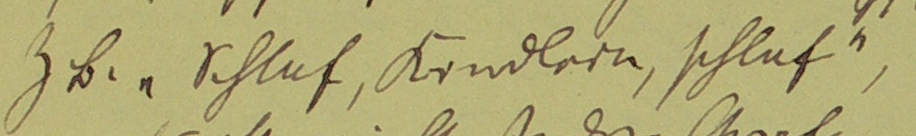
z.B.“ „Schlaf Kindlein schlaf „:-
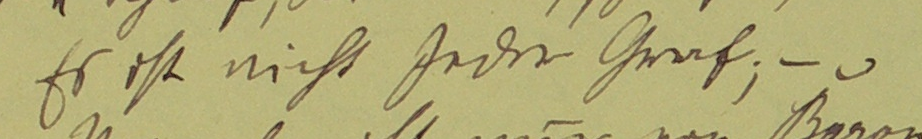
Es ist nicht jeder Graf;-
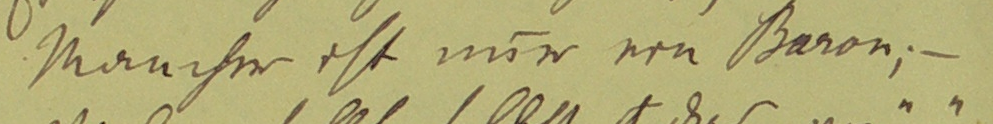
Mancher ist nur ein Baron;-
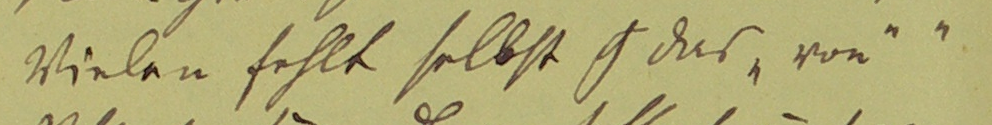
Vielen fehlt selbst auch das „ von“
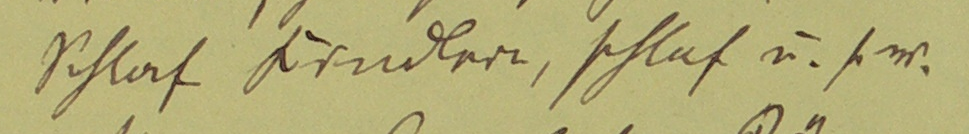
Schlaf Kindlein schlaf u.s.w.
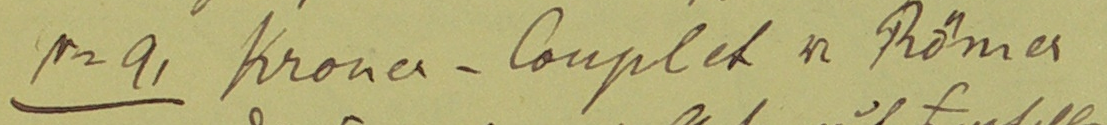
Nr. 9. Kroner-Couplet von Römer
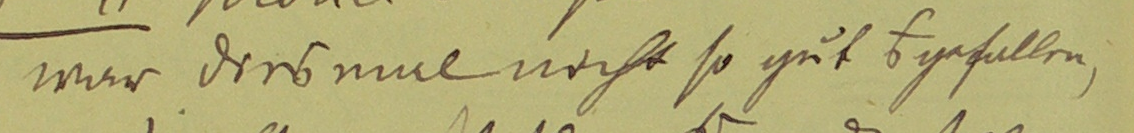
war diesmal nicht so gut ausgefallen
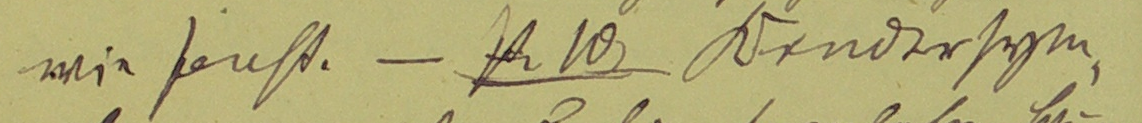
wie sonst.- -Nr. 10. Kindersym¬
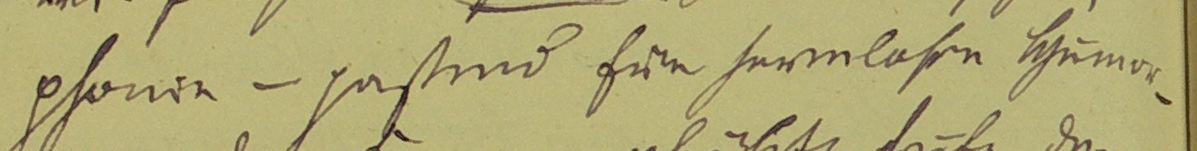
phonie—paßend für formlosen Humor. –
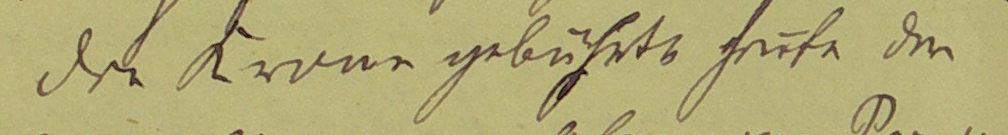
Der Krone gebührte heute der
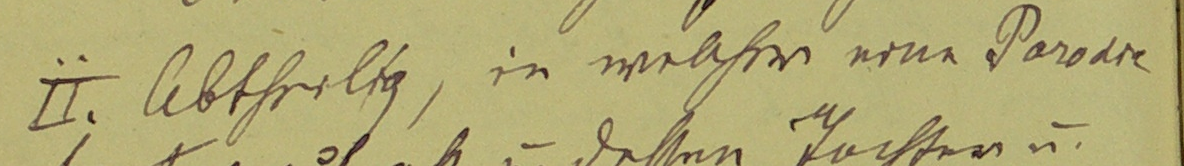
II. Abteilung, in welcher eine Parodie
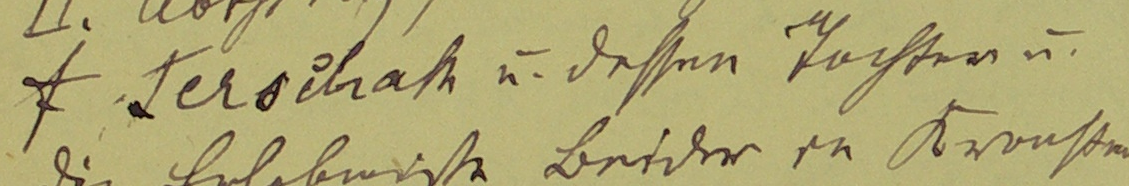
mit Terschak und dessen Tochter und
